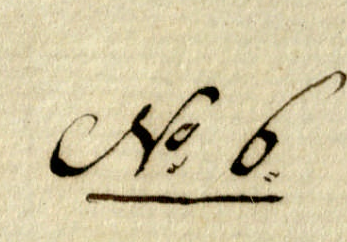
No 6.
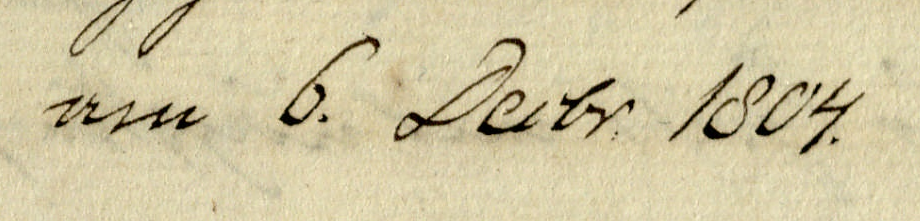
am 6. Decbr. 180.
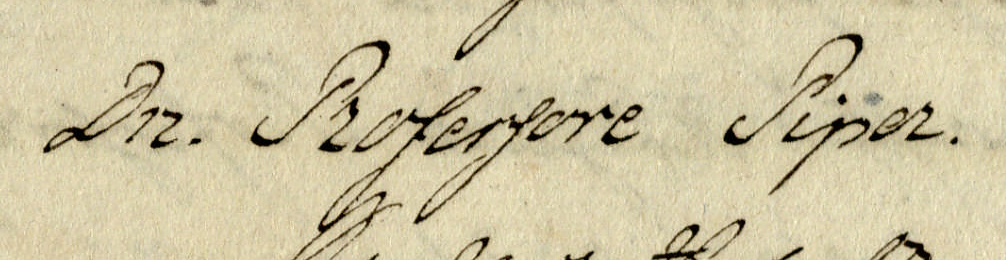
Dn. Professore Piper.
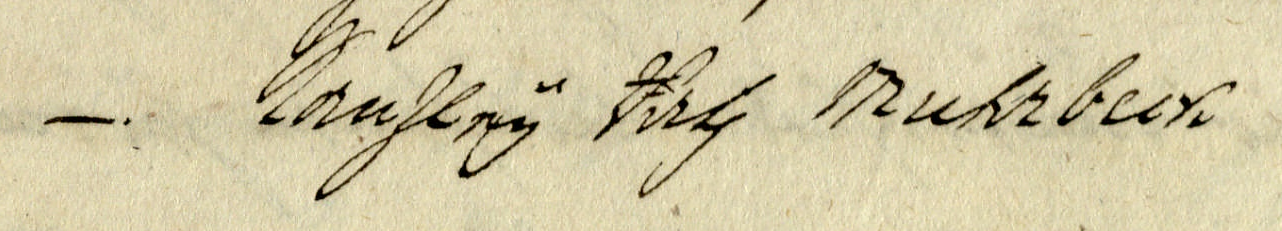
Kanzleÿ Rath Muhrbeck
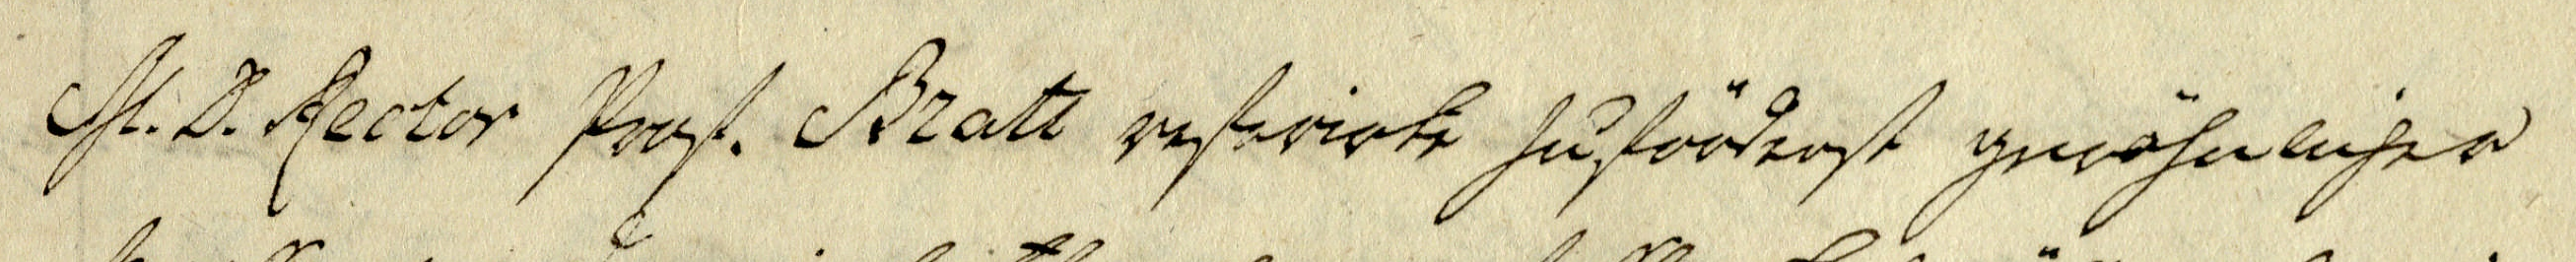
M. D. Rector Prof. Bratt referirte zuförderst gewöhnlicher
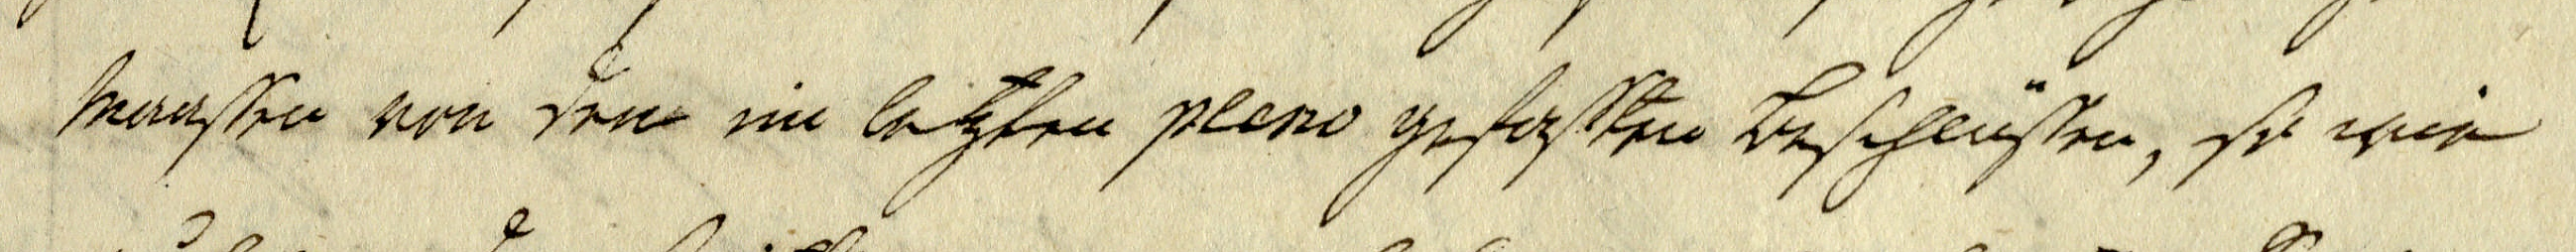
Maassen von den im letzten pleno gefaßten Beschlüssen, so wie
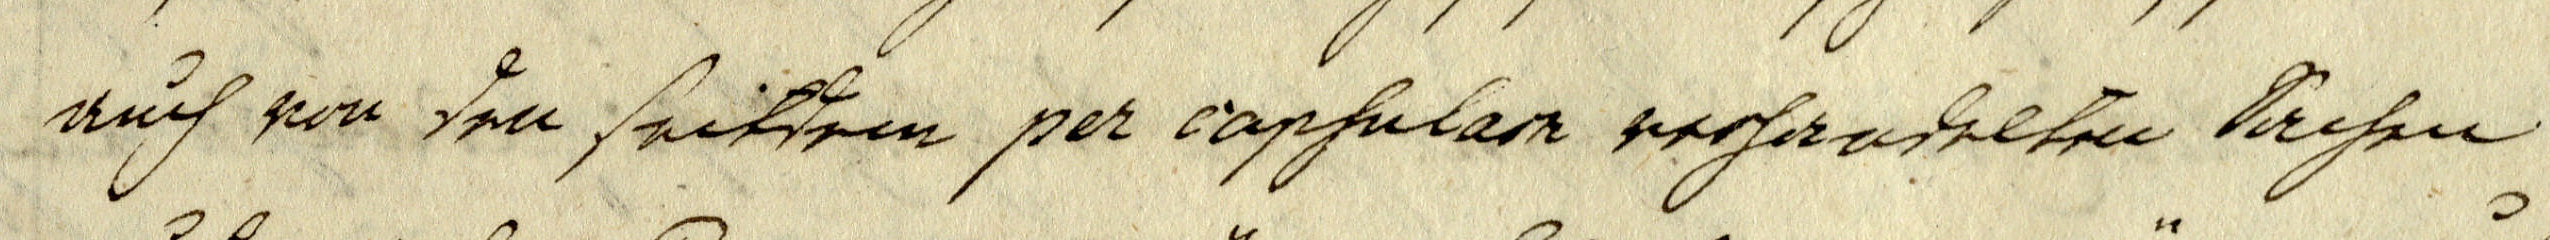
auch von den seitdem per capsulam verhandelten Sachen
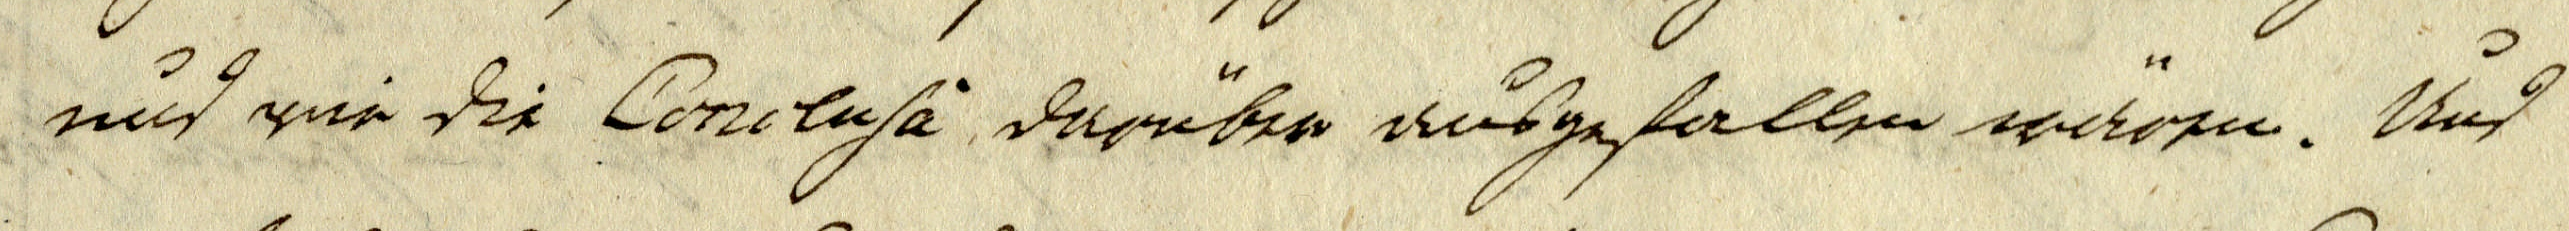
und wie die Conclusa darüber ausgefallen wären. Und
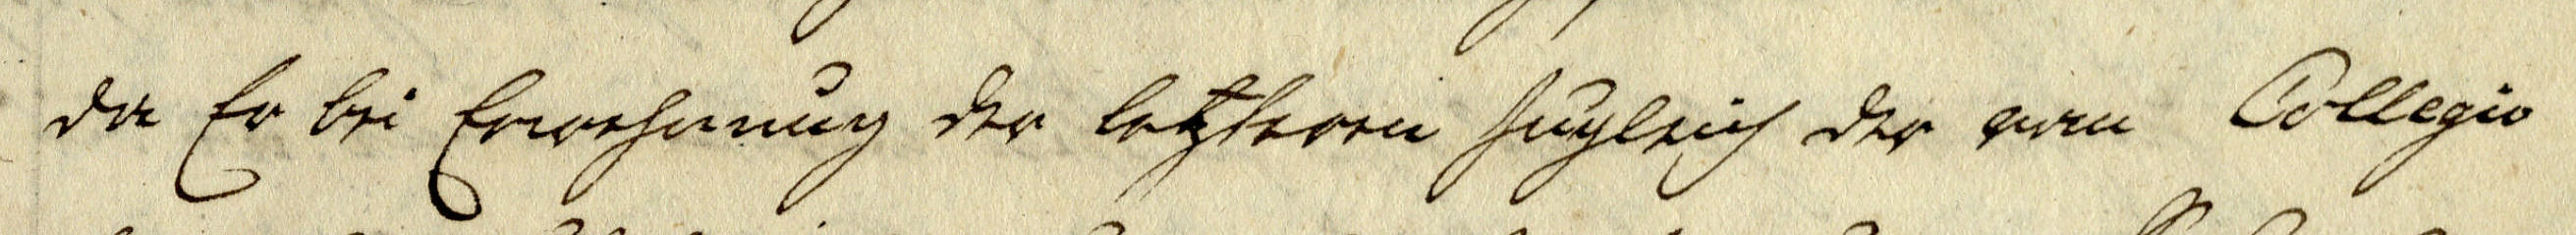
da Er bei Erwehnung der letzteren zugleich der vom Collegio
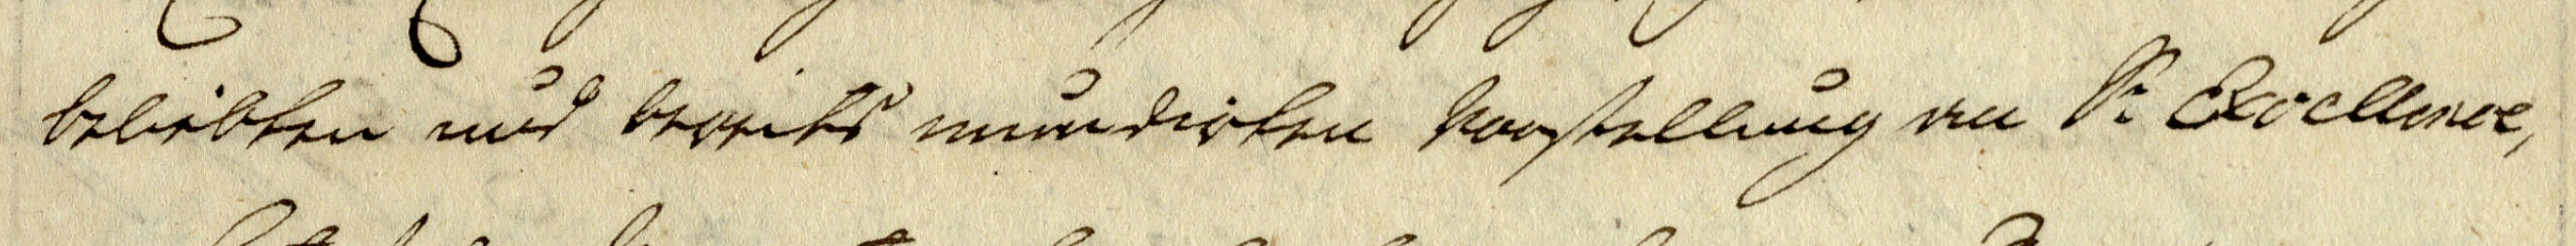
beliebten und bereits mundirten Vorstellung an Sr Excellence,
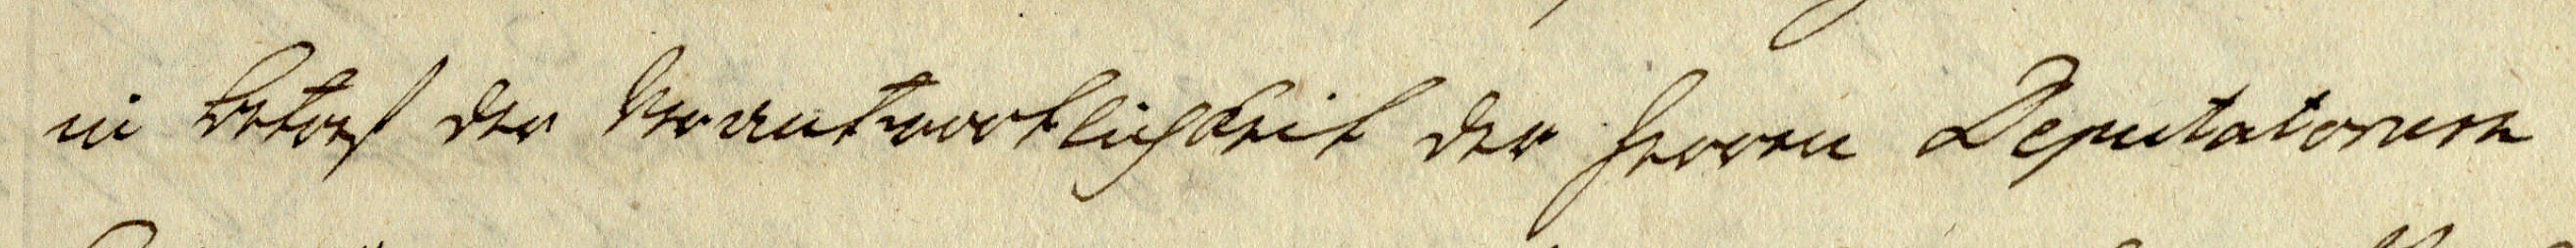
in Betref der Verantwortlichkeit der Herren Deputatorum
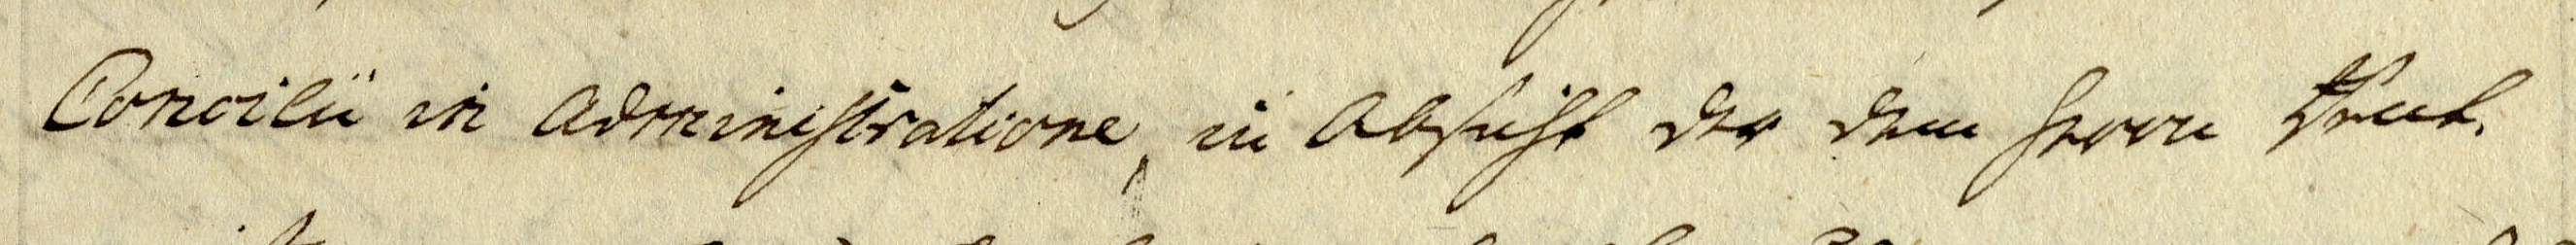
Concilii in Administratione, in Absicht der dem Herrn Rent¬
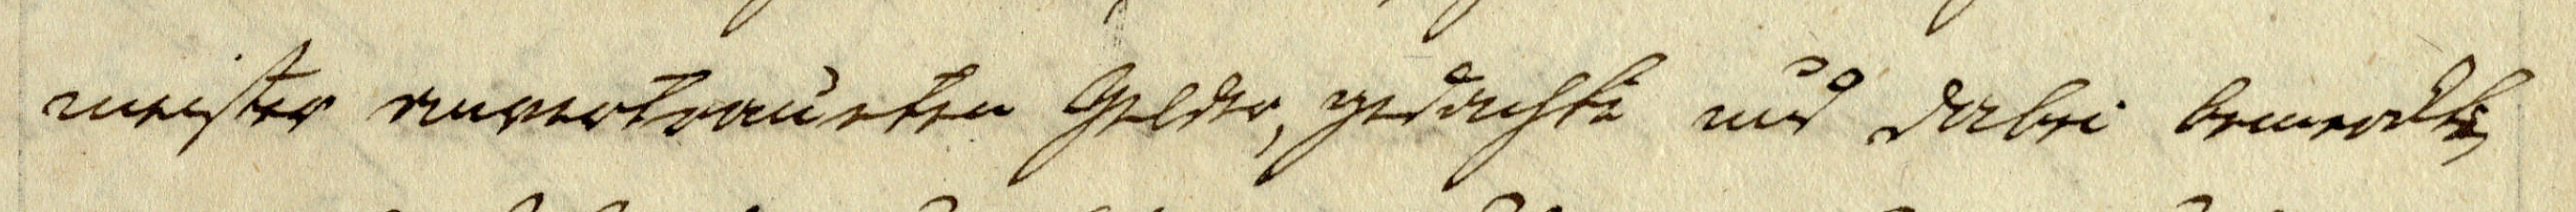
meister anvertraueten Gelder, gedachte und dabei bemerckte,
